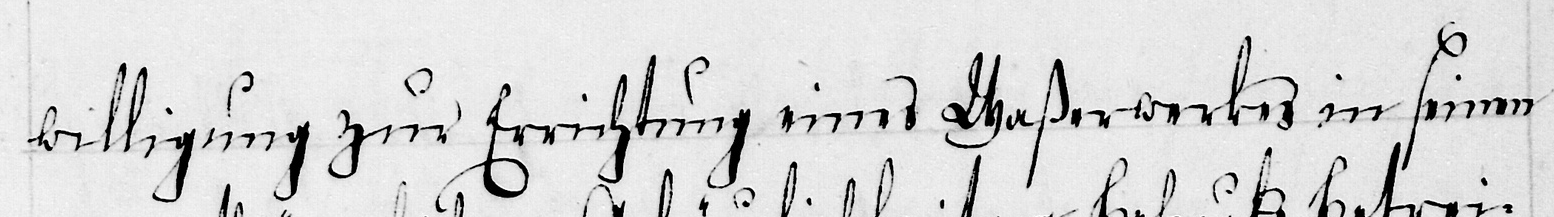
willigung zur Errichtung eines Waßerwerkes in seinen
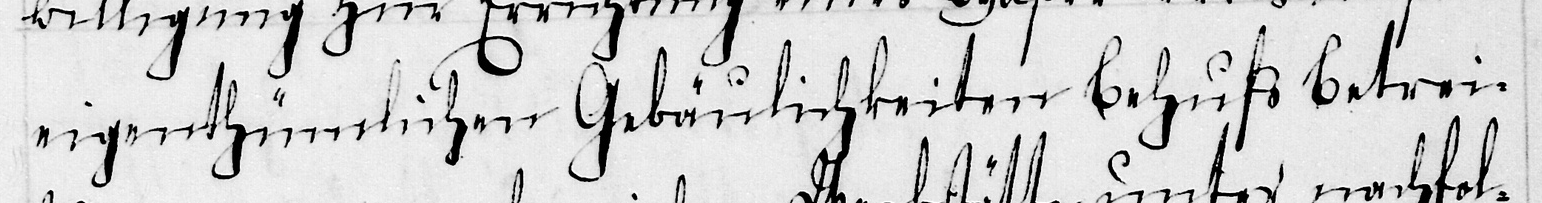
eigenthümlichen Gebäulichkeiten Behufs Betrei¬
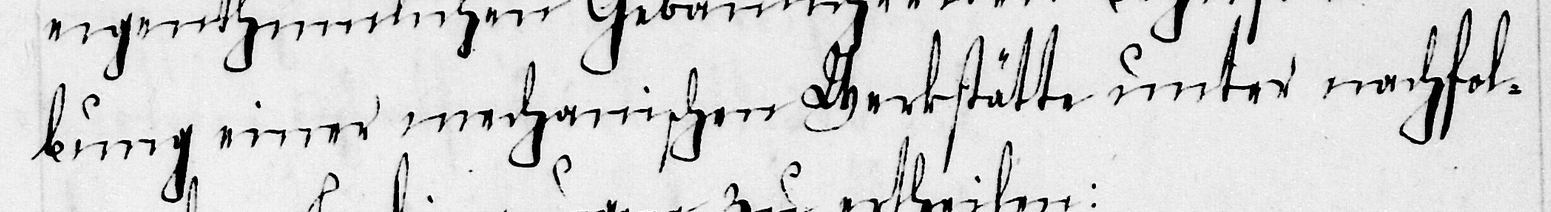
bung einer mechanischen Werkstätte unter nachfol¬
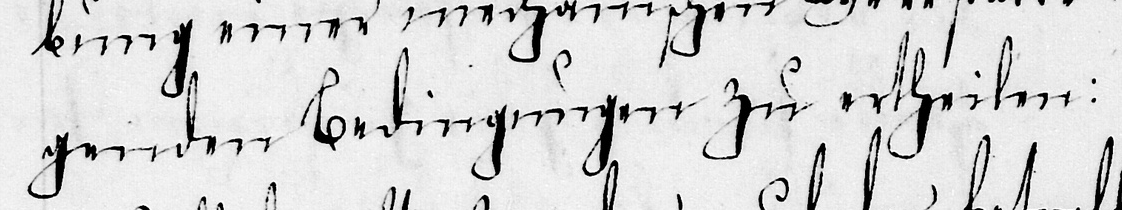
genden Bedingungen zu ertheilen:
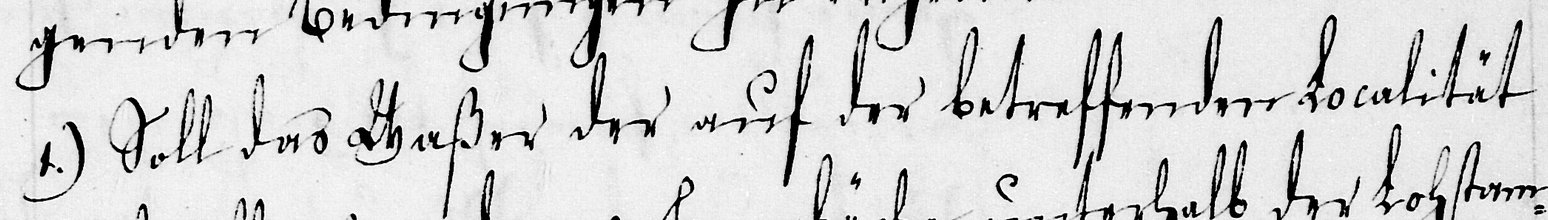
1.) Soll das Waßer der auf der betreffenden Localität
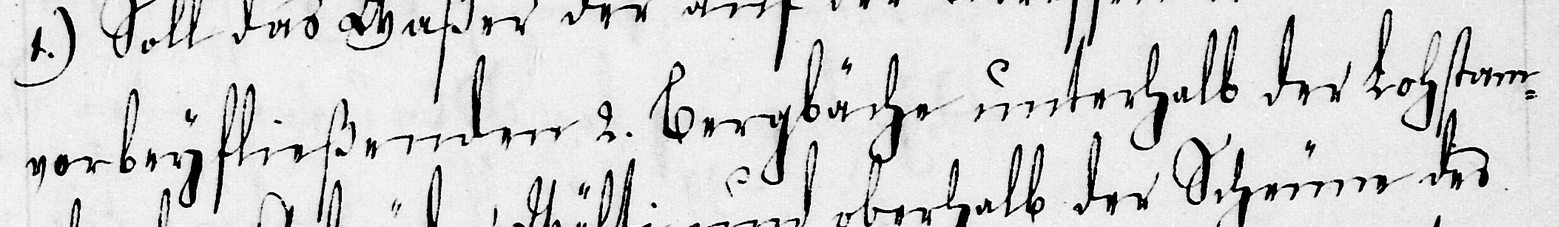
vorbeyfließenden 2. Bergbäche unterhalb der Lohstam¬
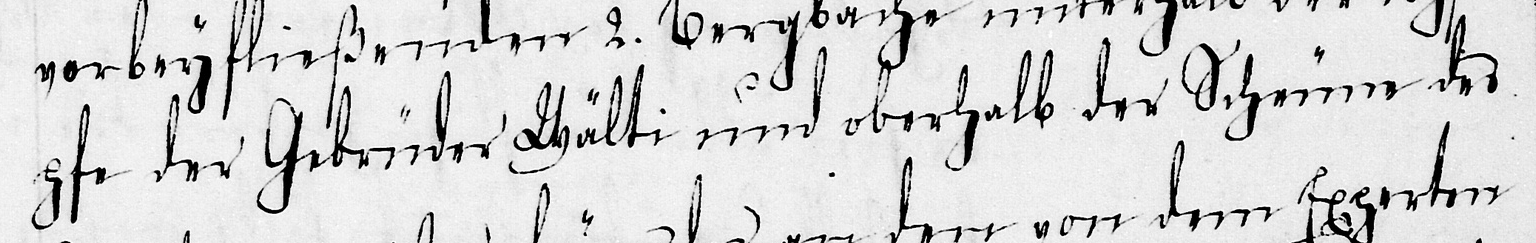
pfe der Gebrüder Wälti und oberhalb der Scheune des
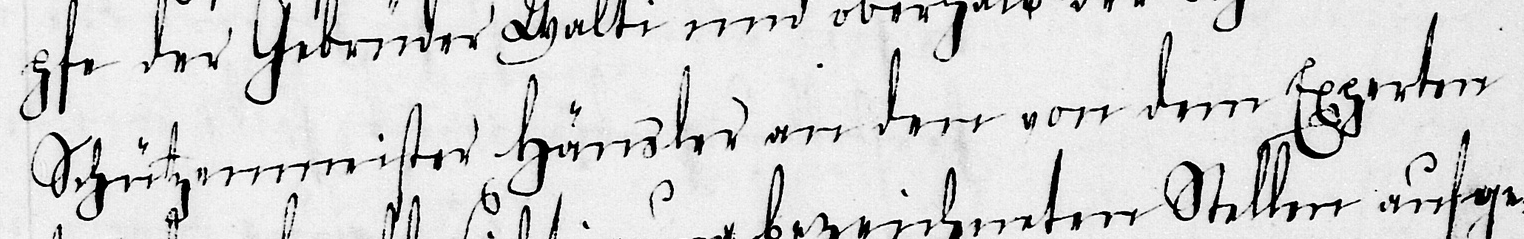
Schützenmeister Hänsler an den von dem Experten
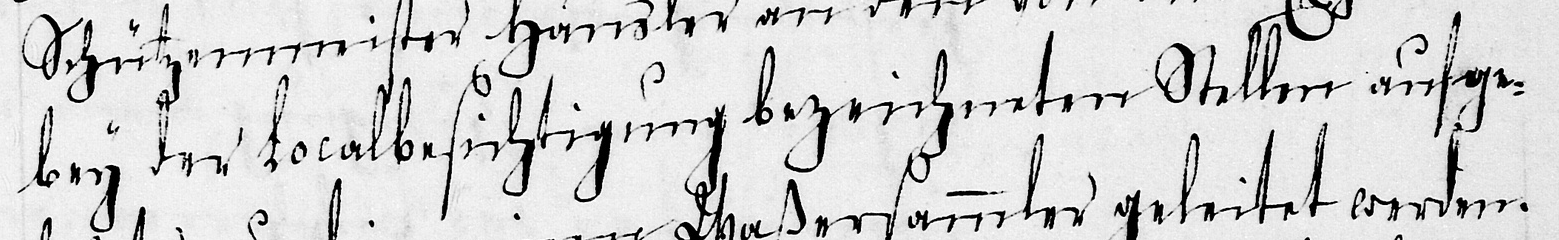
bey der Localbesichtigung bezeichneten Stellen aufge¬
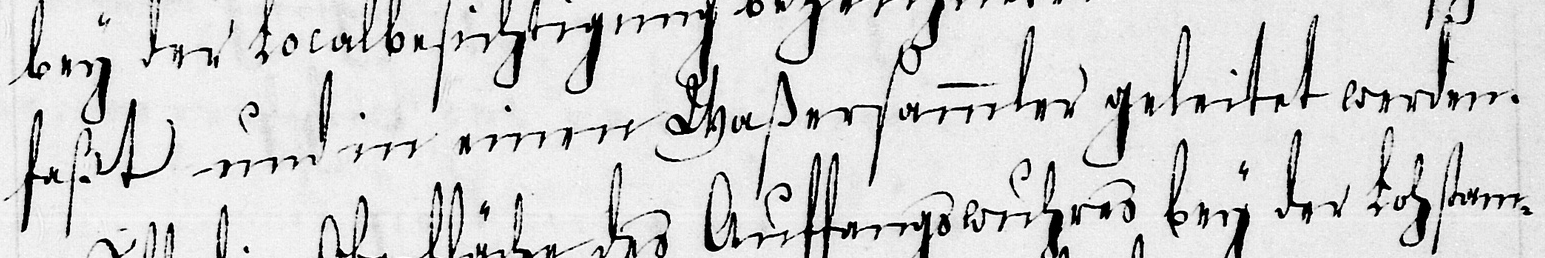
faßt und in einen Waßersammler geleitet werden.
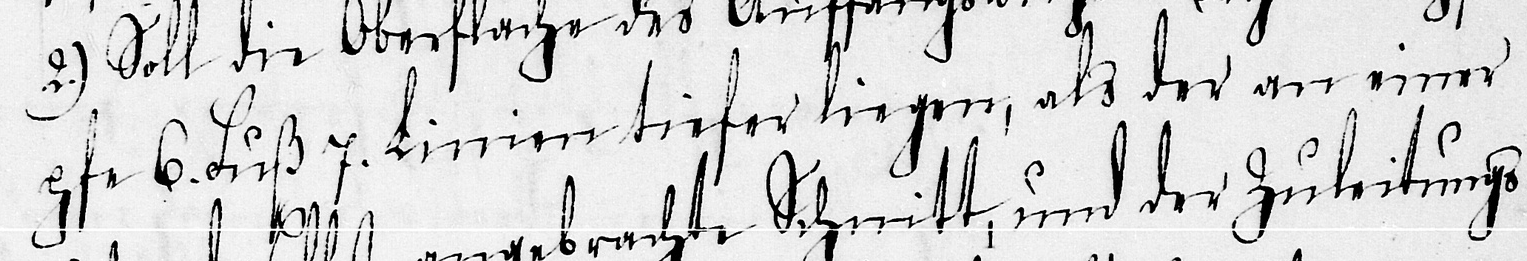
pfe 6. Fuß 7. Linien tiefer liegen, als der an einer
